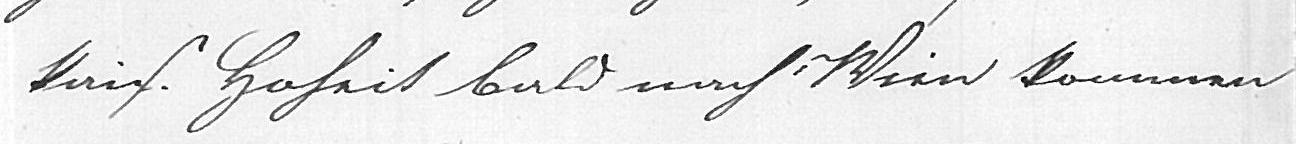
kais. Hoheit bald nach Wien kommen
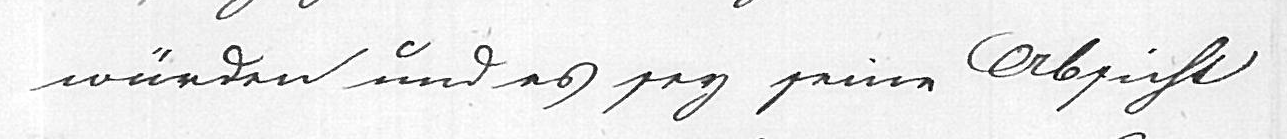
würden und es sey seine Absicht
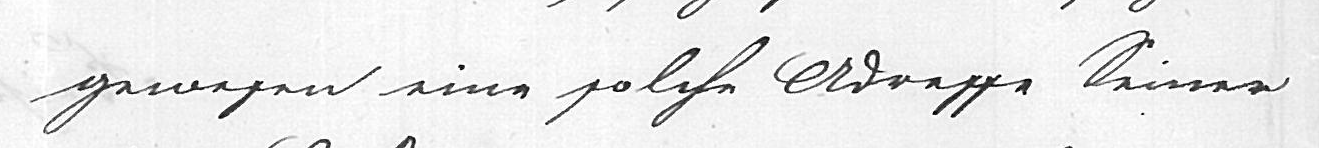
gewesen eine solche Adresse Seiner
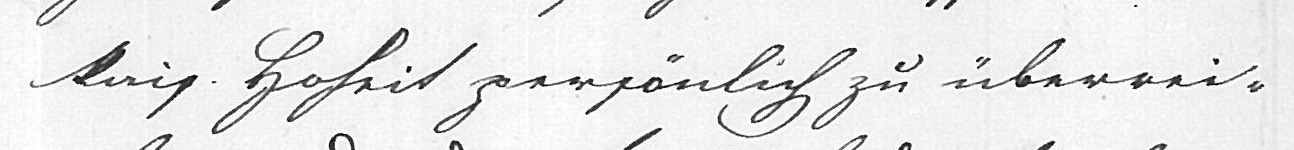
kais. Hoheit persönlich zu überrei-
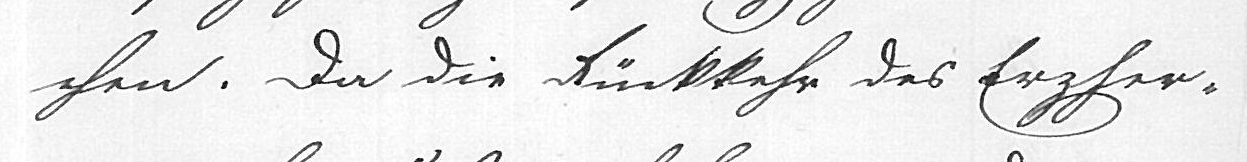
chen. Da die Rückkehr des Erzher-
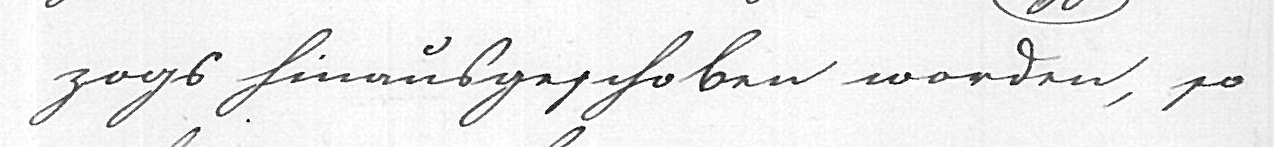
zogs hinausgeschoben worden, so
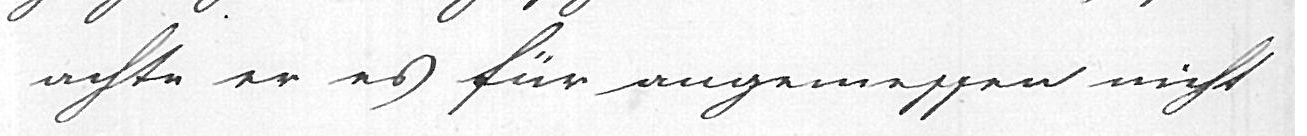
achte er es für angemessen nicht
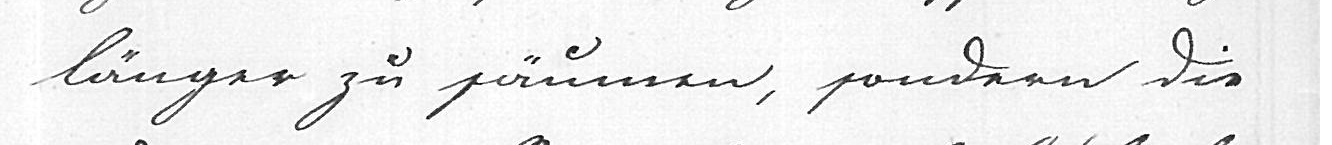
länger zu säumen, sondern die
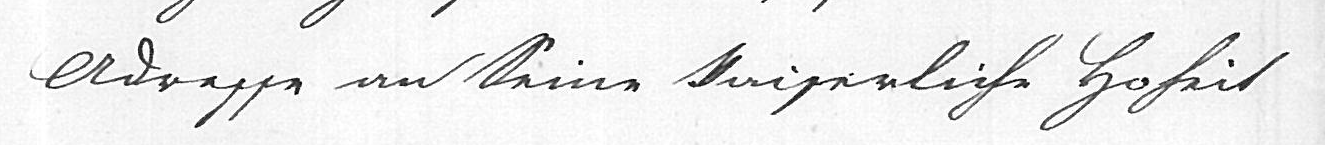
Adresse an Seine kaiserliche Hoheit
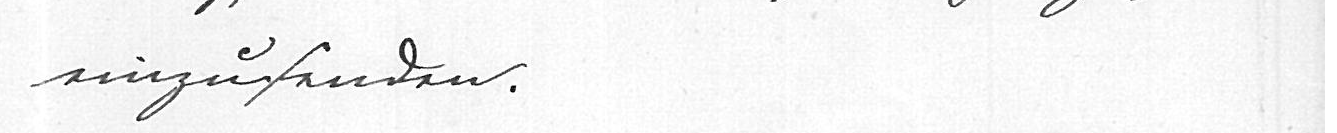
einzusenden.
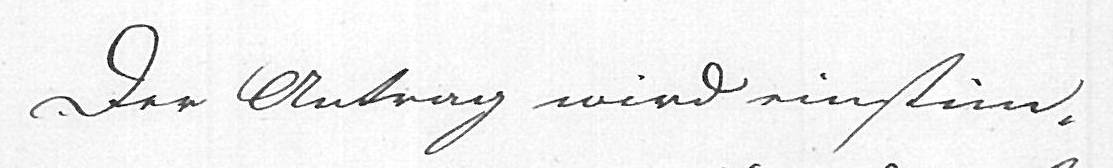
Der Antrag wird einstim-
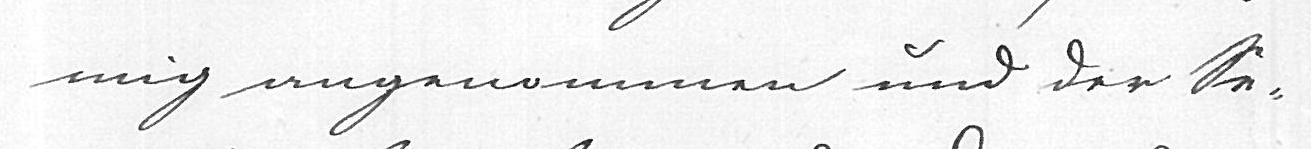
mig angenommen und der Se-
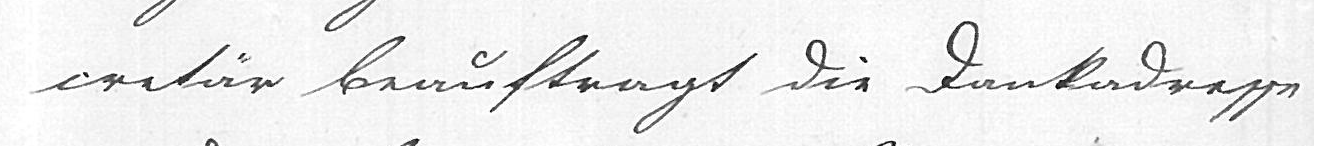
cretär beauftragt die Denkadrese
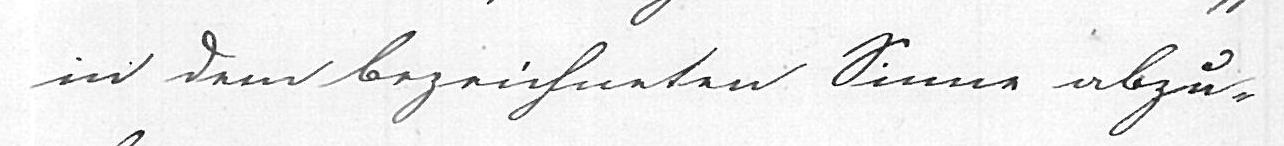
in dem bezeichneten Sinne abzu-
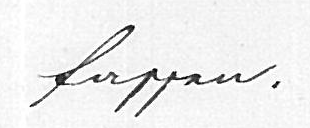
fassen.
